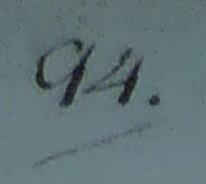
94.
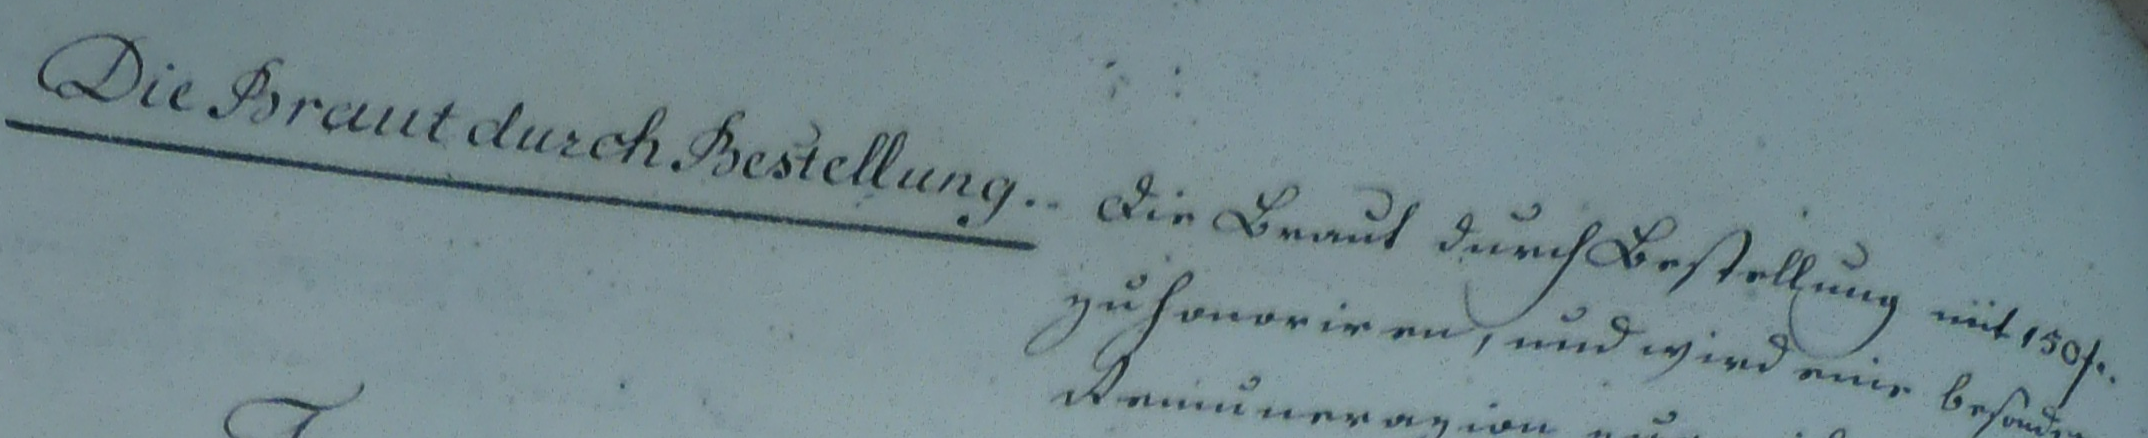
Die Braut durch Bestellung. Die Braut durch Bestellung mit 150fr.
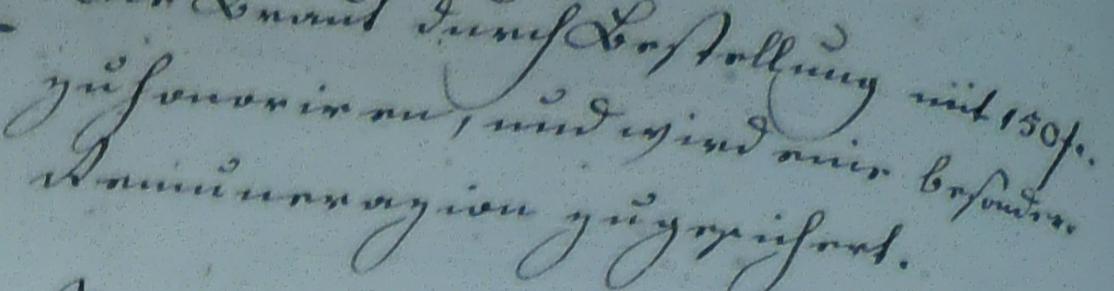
zuhonoriren, und wird eine besondere
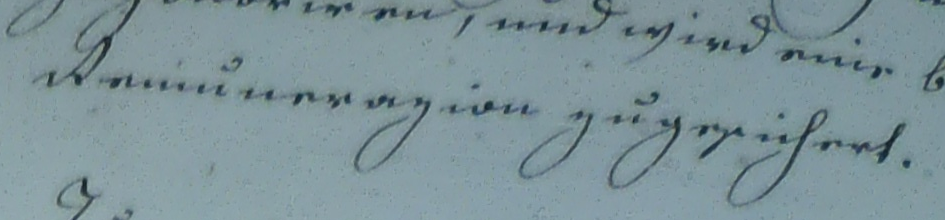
Remunerazion zugesichert.
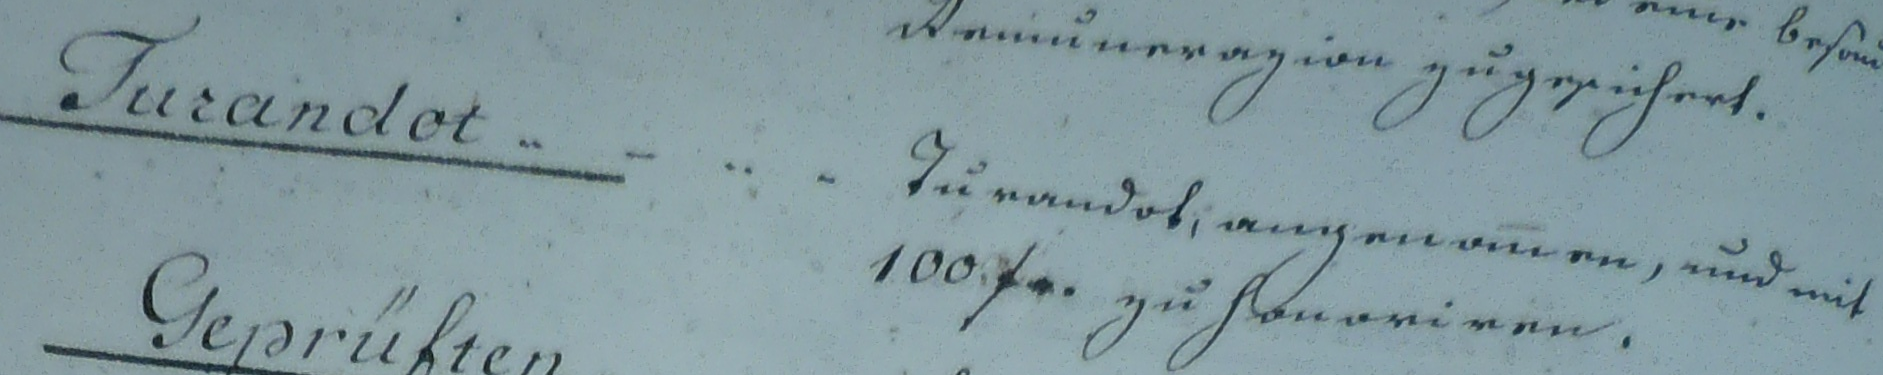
Turandot .. .. .. .. Turandot, angenom̅en, und mit
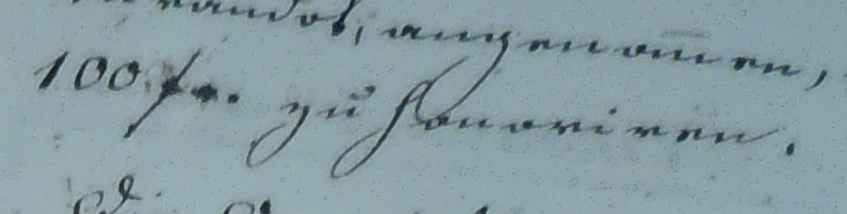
100fr. zu honoriren.
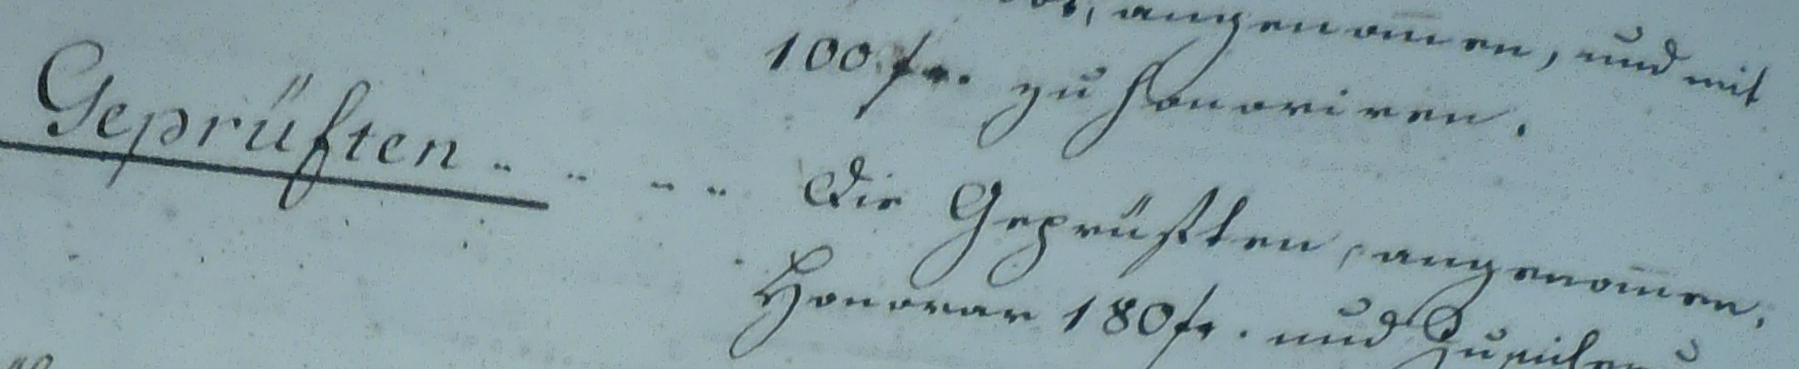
Geprüften .. .. .. .. Die Geprüften, angenom̅en,
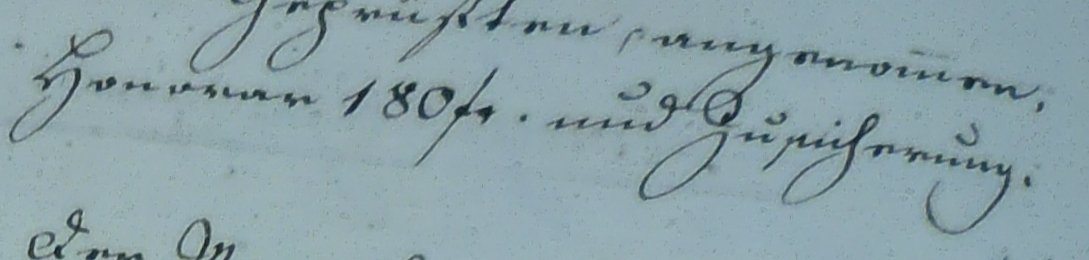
Honorar 180fr. und Zusicherung.
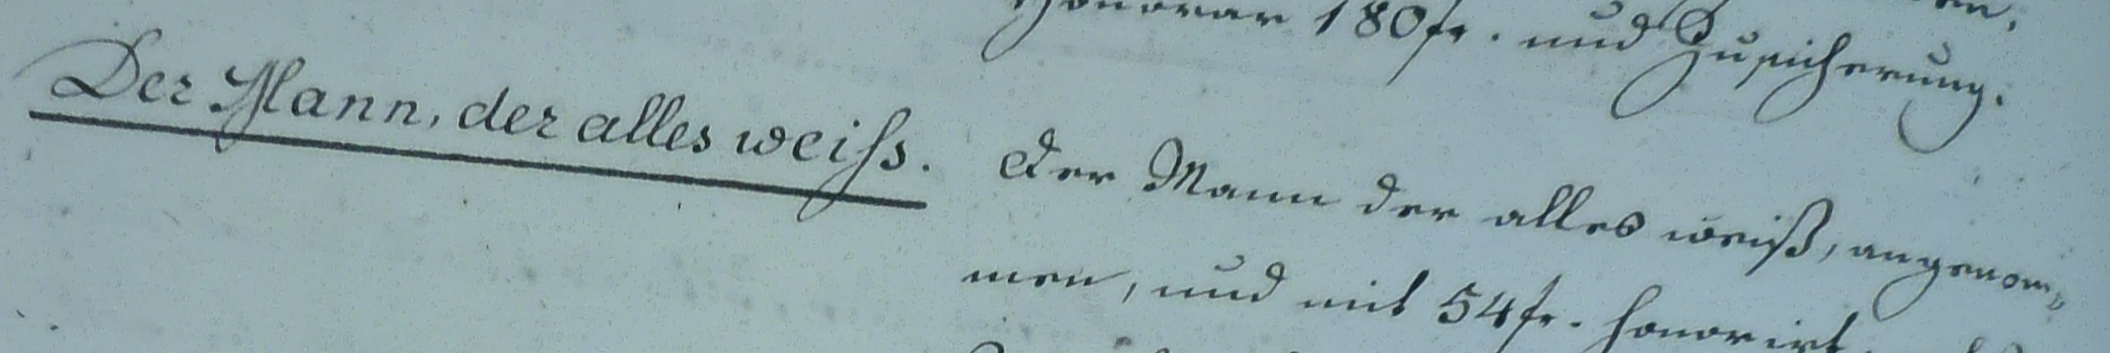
Der Mann, der alles weiss. Der Mann der alles weiß, angenem¬
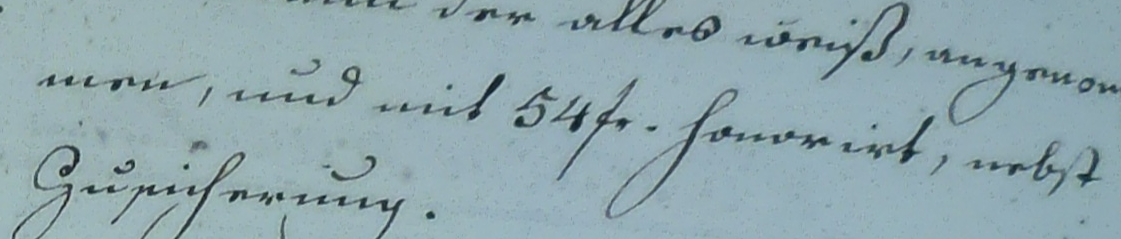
men, und mit 54fr. honorirt, nebst
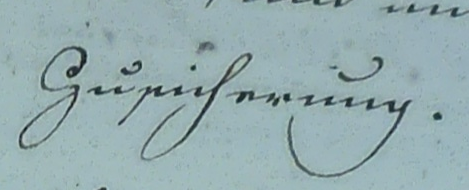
Zusicherung.
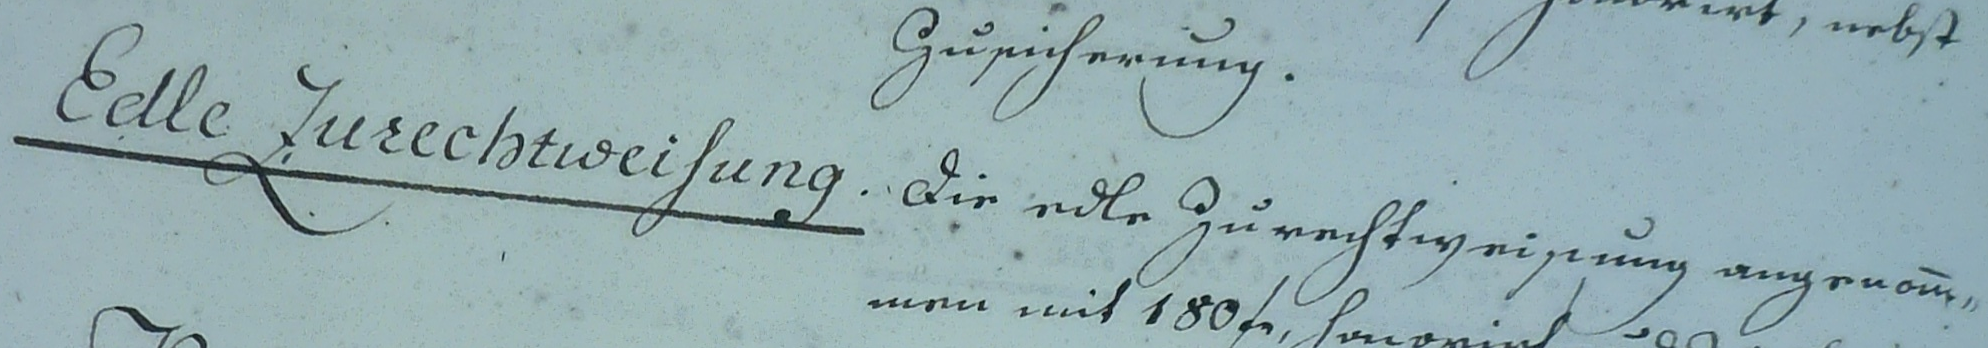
Edle Zurechtweisung . Die edle Zurechtweisung angenom̅¬
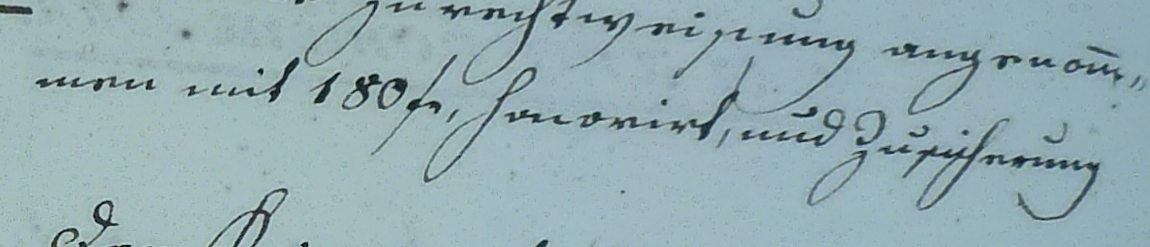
men mit 100fr. honorirt, und Zusicherung
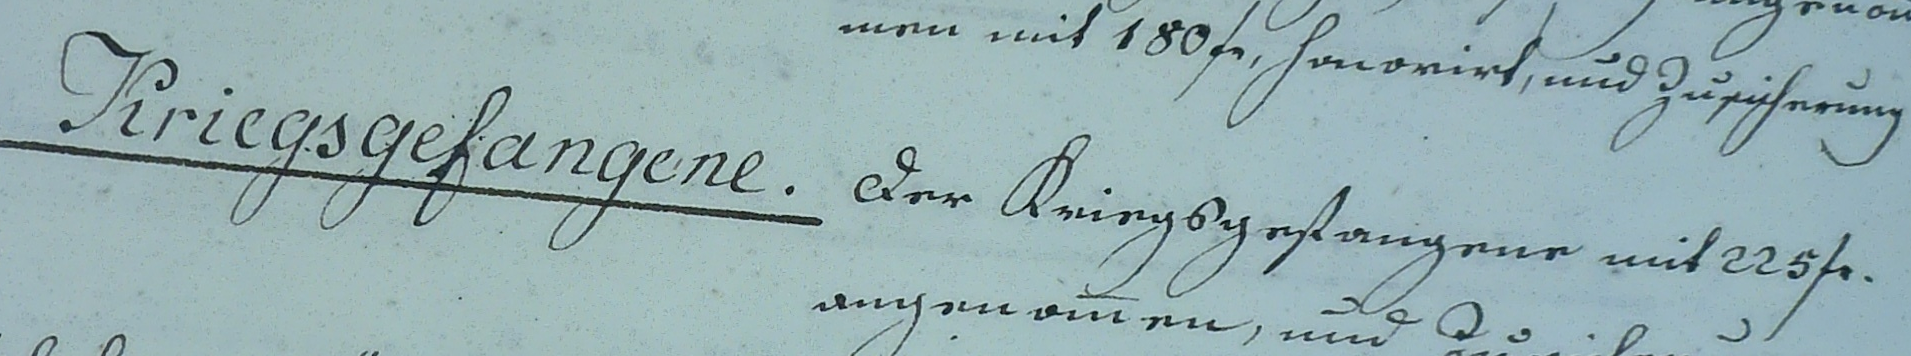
Kriegsgefangene. Der Kriegsgefangene mit 225fr.
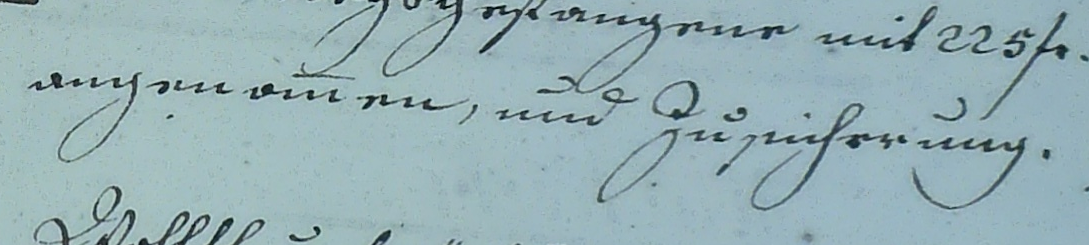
angenom̅en, und Zusicherung.
